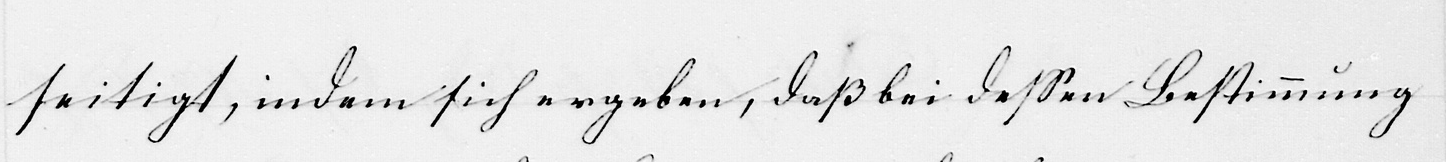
seitigt, indem sich ergeben, daß bei deßen Bestimmung
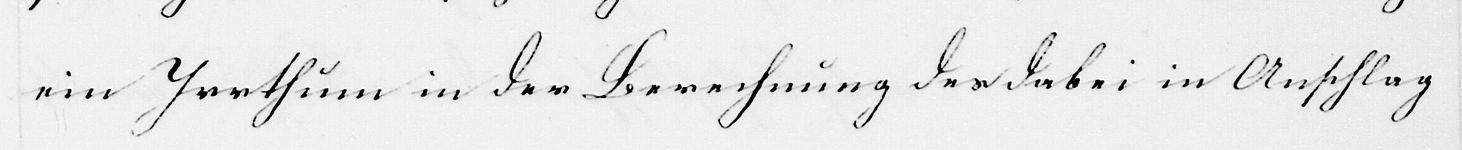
ein Irrthum in der Berechnung des dabei in Anschlag
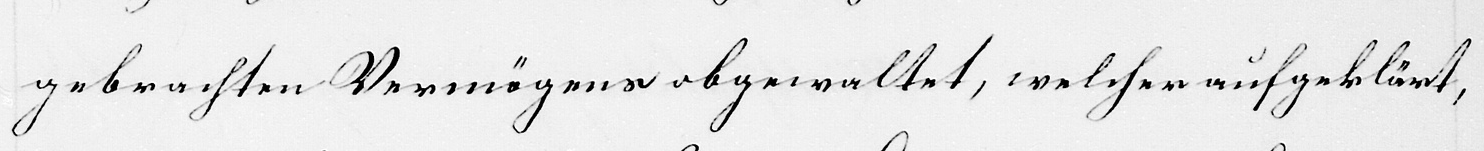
gebrachten Vermögens obgewaltet, welcher aufgeklärt,
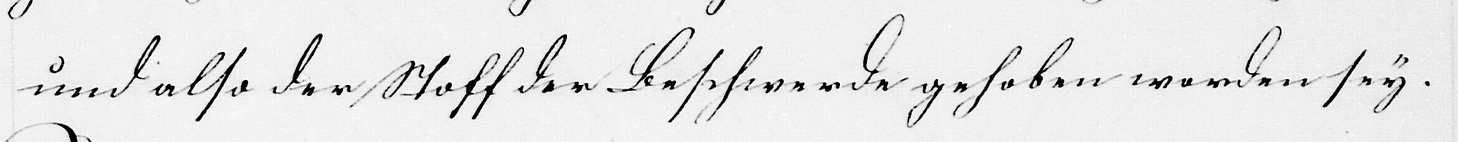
und also der Stoff der Beschwerde gehoben worden sey.
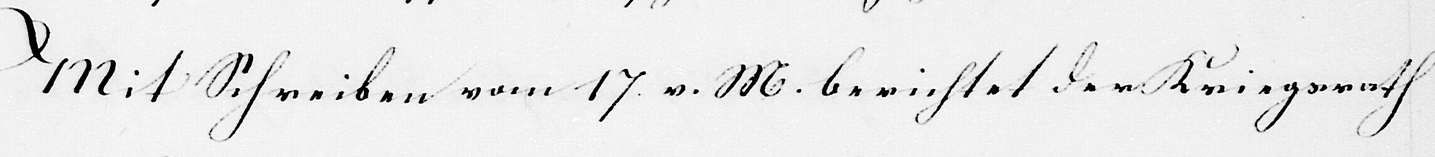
Mit Schreiben vom 17. v. M. berichtet der Kriegsrath
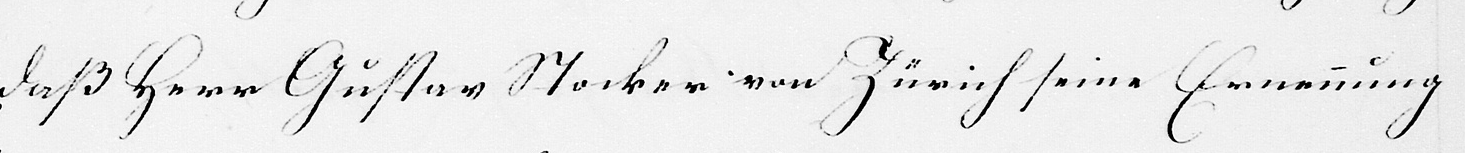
daß Herr Gustav Stocker von Zürich seine Ernennung
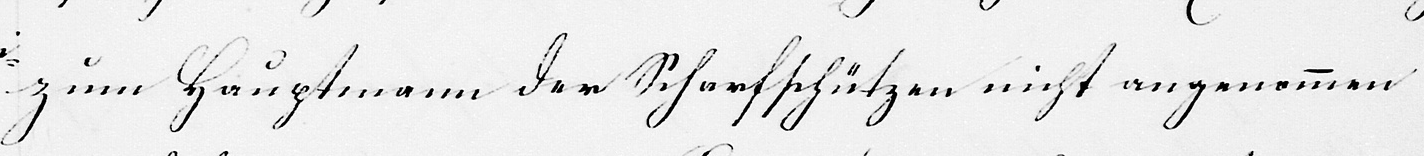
zum Hauptmann der Scharfschützen nicht angenommen
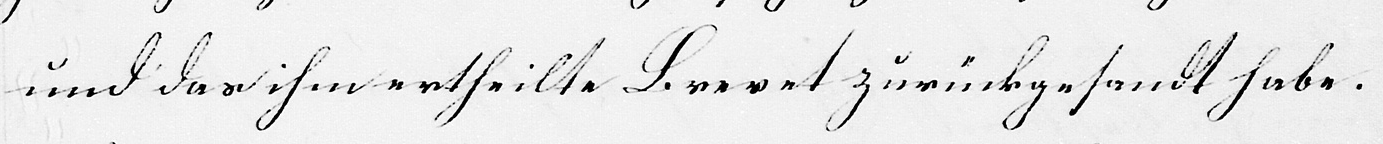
und das ihm ertheilte Brevet zurückgesandt habe.
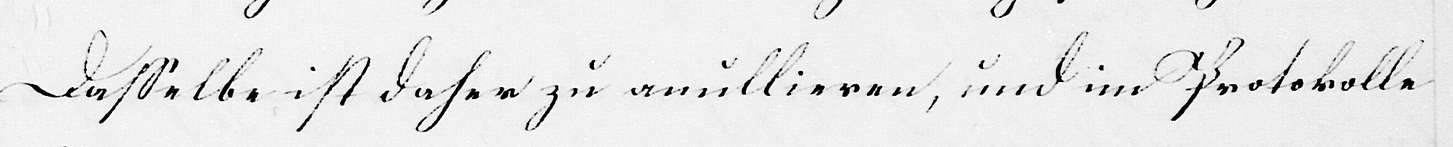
Daßelbe ist daher zu anullieren, und im Protokolle
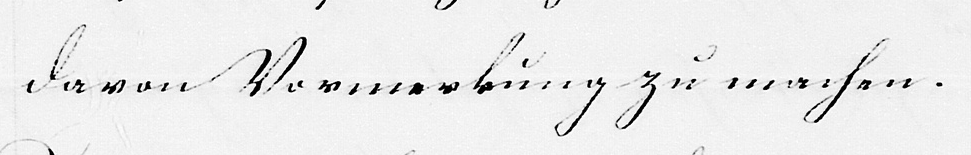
davon Vormerkung zu machen.
